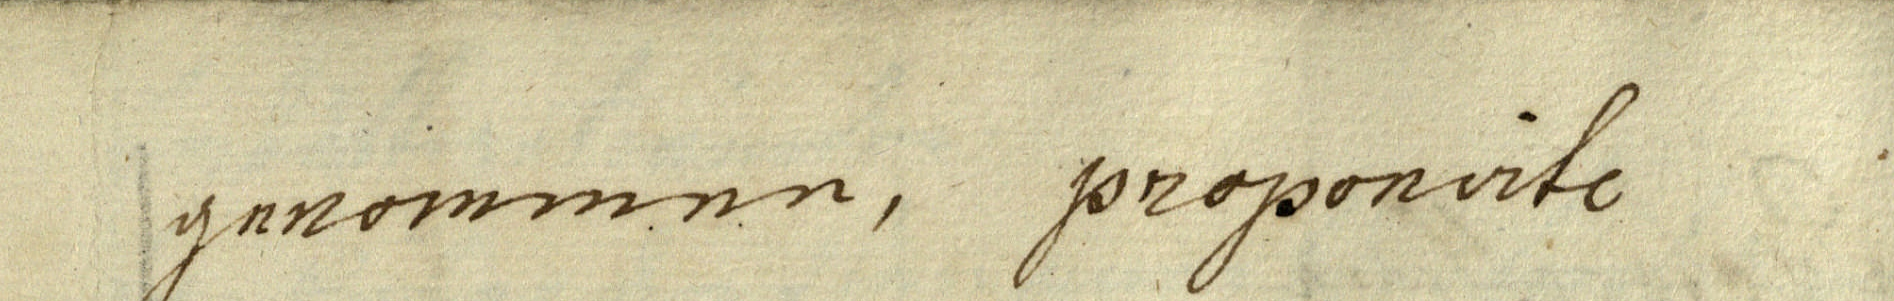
genommen, proponirte
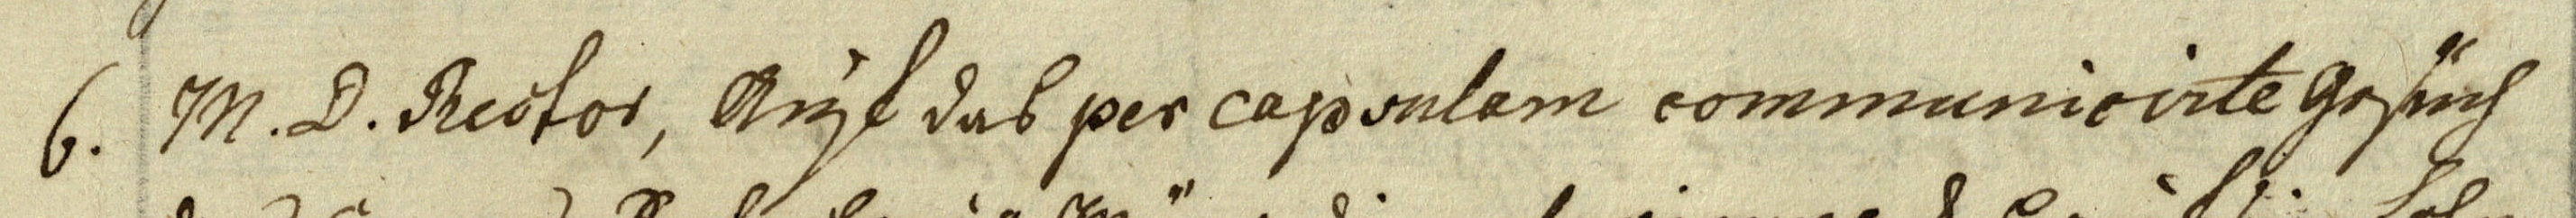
6. M. D. Rector, Auf das per capsulam communicirte Gesuch
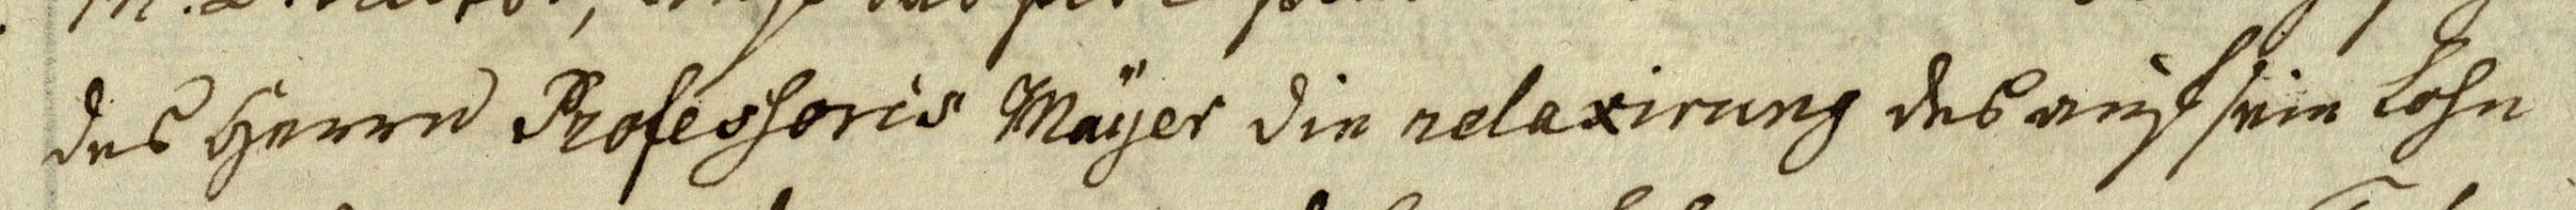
des Herrn Professoris Maÿer die relaxirung des auf sein Lohn
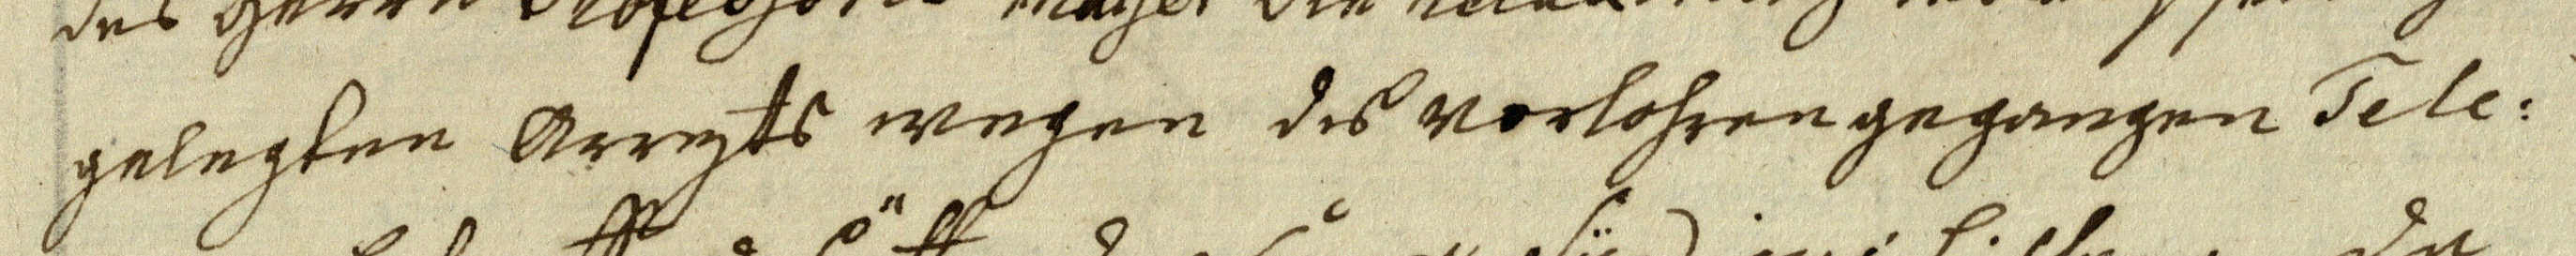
gelegten Arrests wegen des verlohren gegangenTele¬
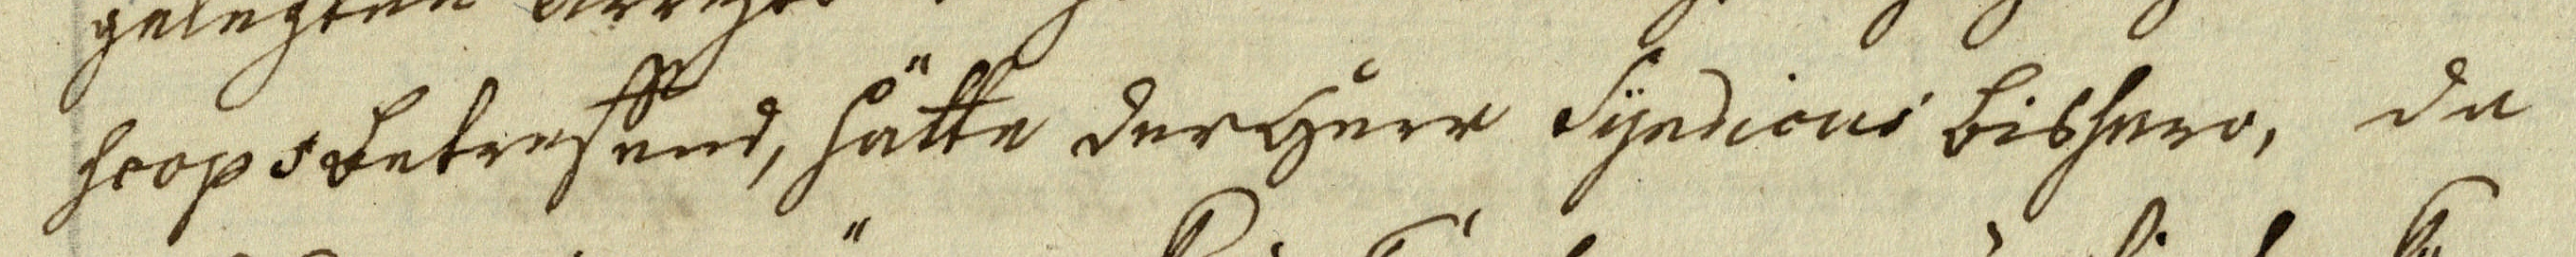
scops betreffend, hätte der Herr Sÿndicus bishero , da
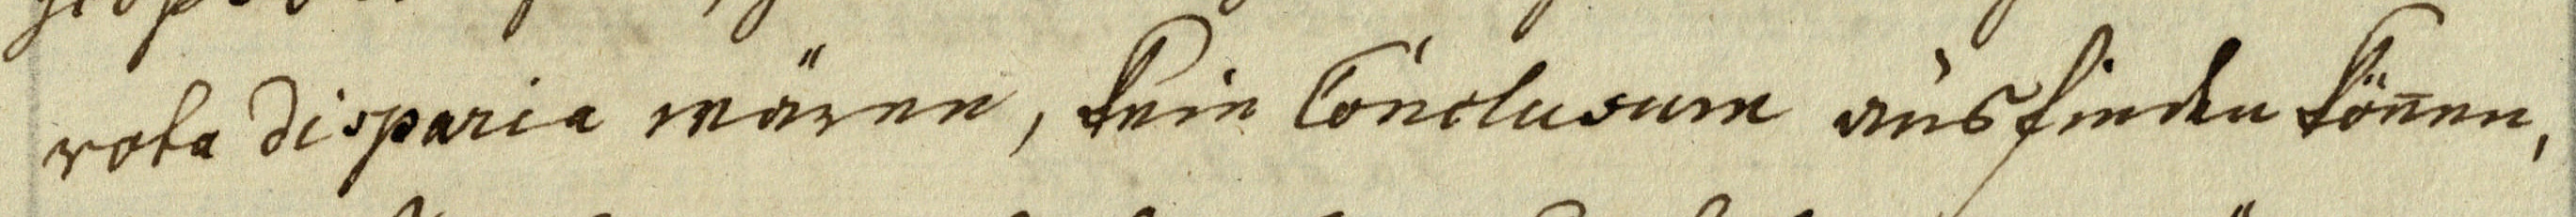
vota disparia wären, kein Conclusum ausfinden könen,
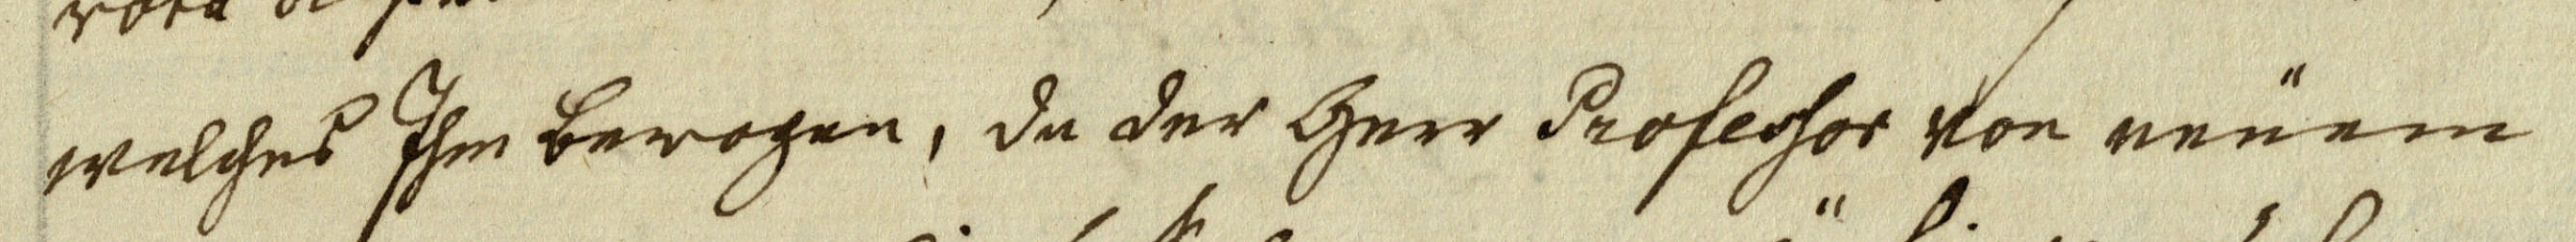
welches Ihm bewogen, da der Herr Professor von neuem
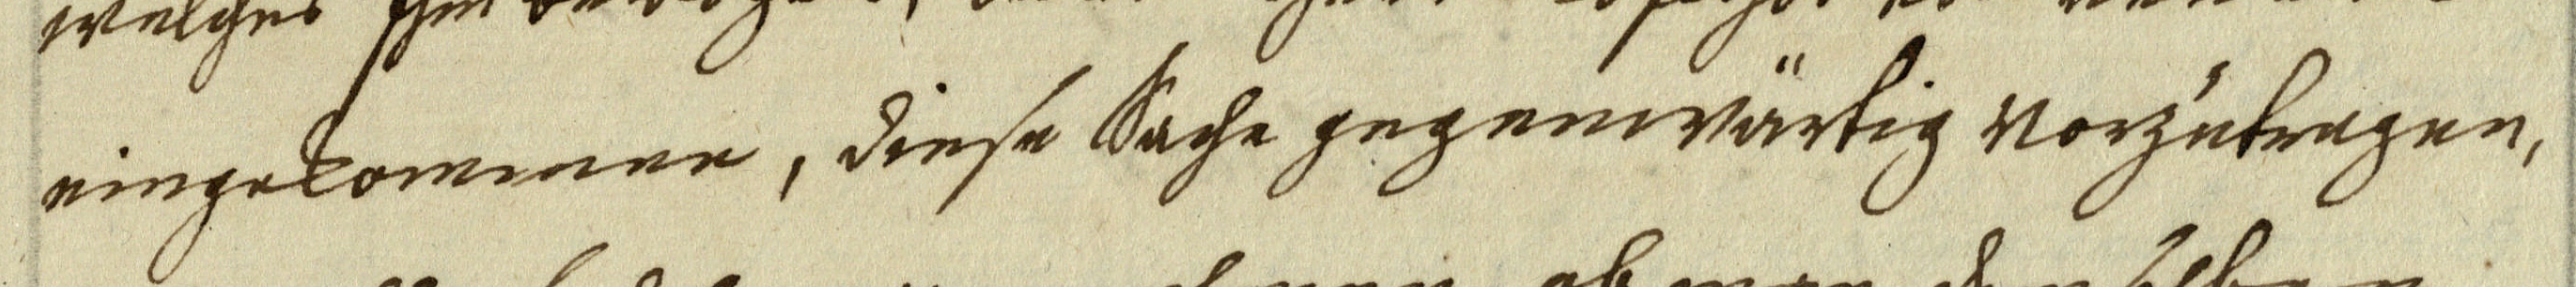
eingekommen, diese Sache gegenwärtig vorzutragen
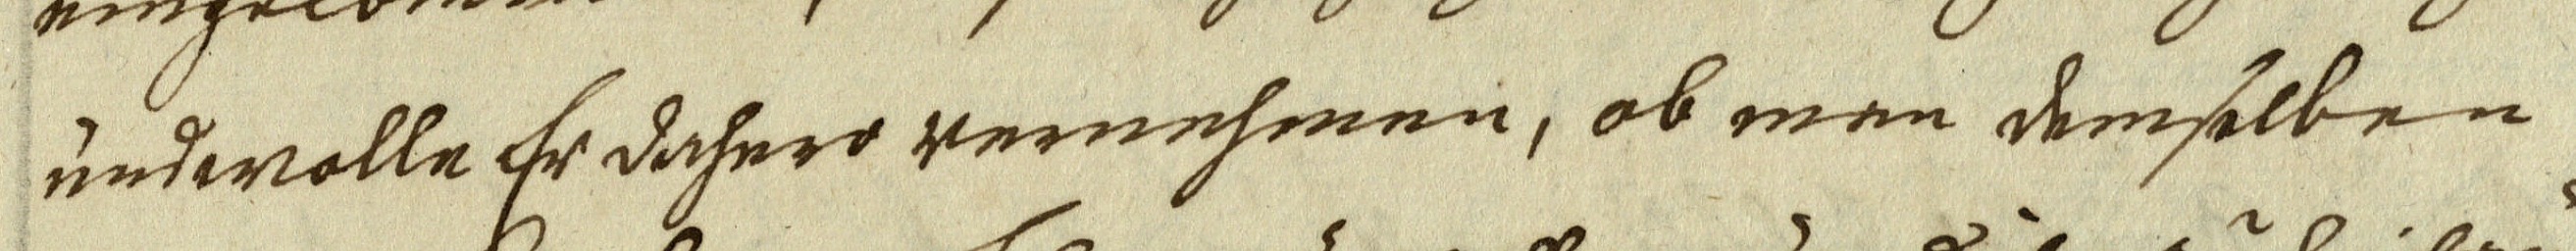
und wolle Er daher vernehmen, ob man demselben
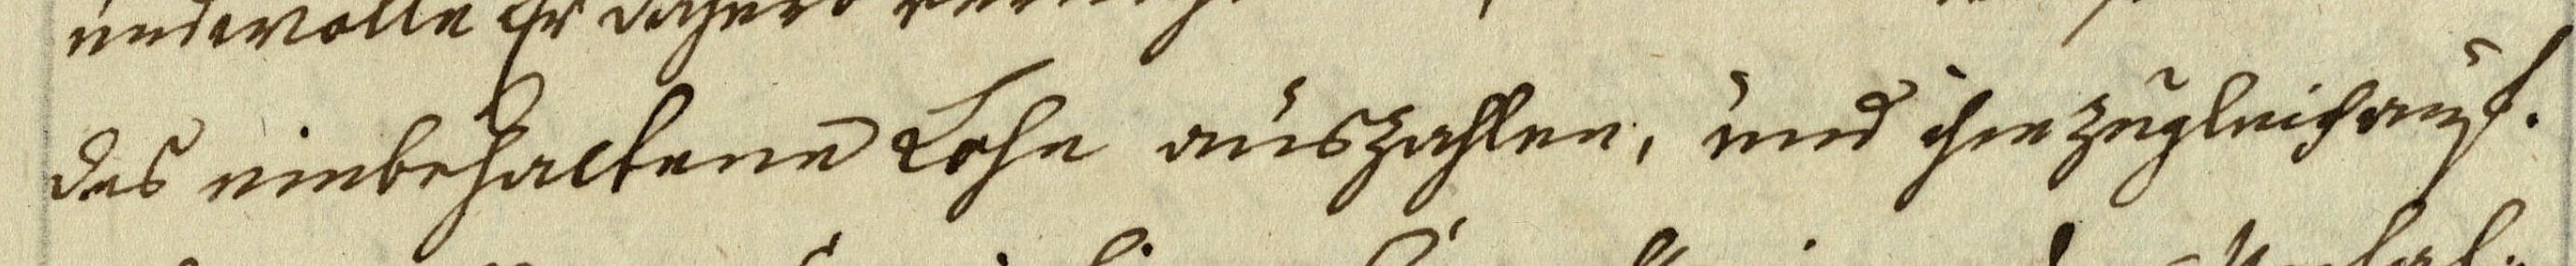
das einbehaltene Lohn auszahlen, und ihm zugleich auf¬
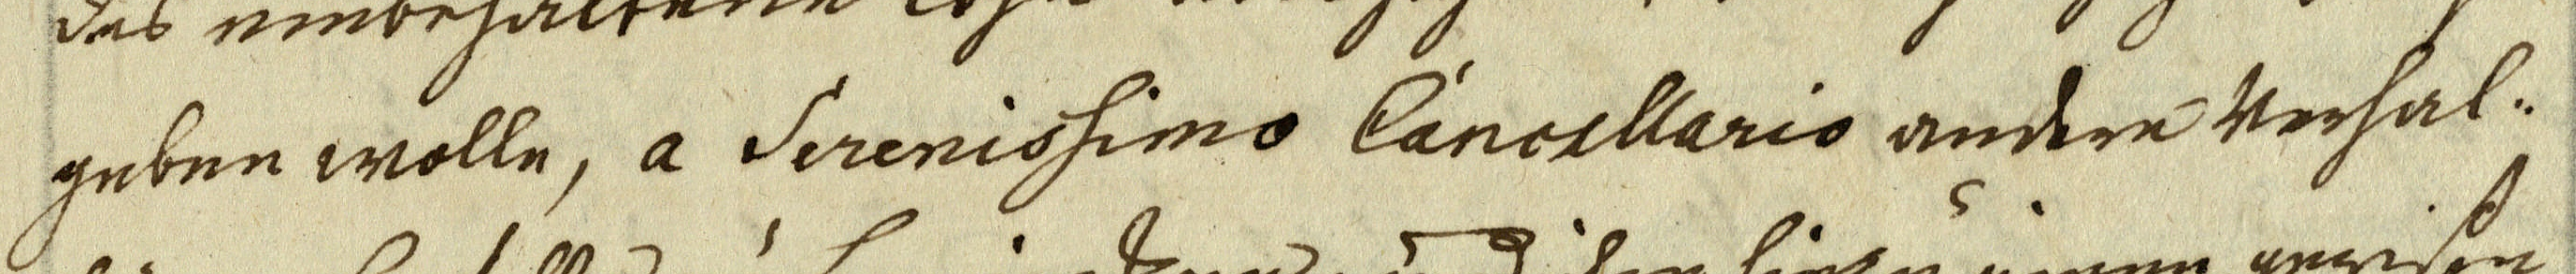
geben wolle, a Serenissimo Cancellario andere Verhal¬
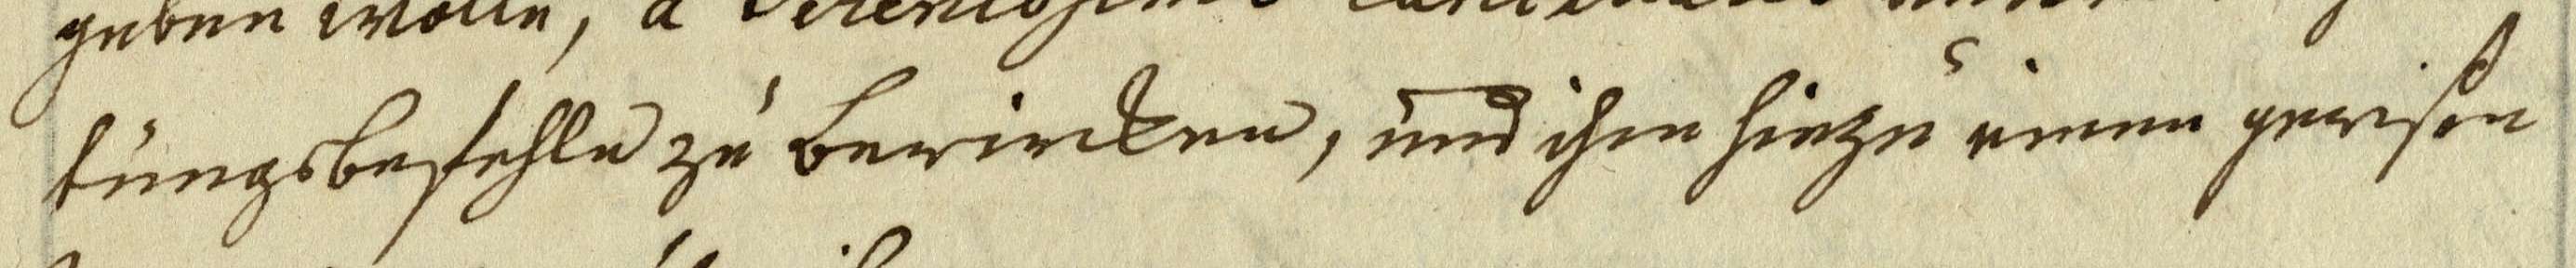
tungsbefehle zu bewircken, und ihm hiezu einen gewißen
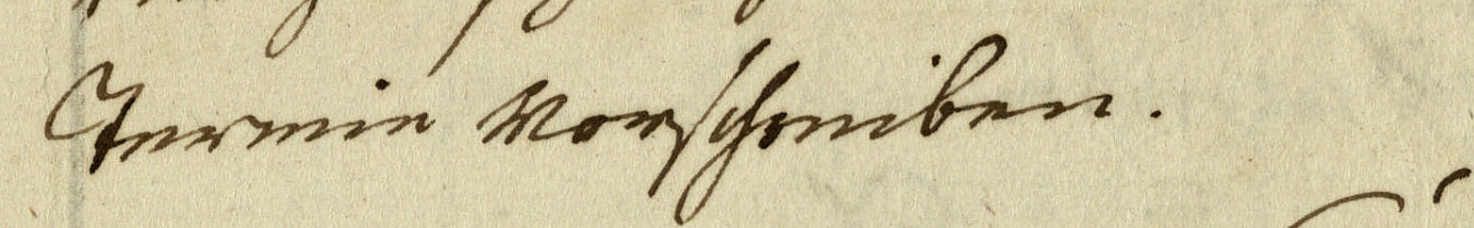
Termin vorschreiben.
